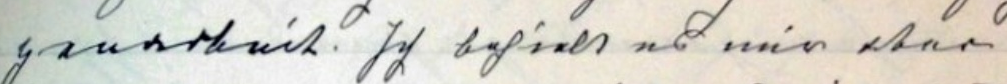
penarbeit. Ich behielt es mir aber
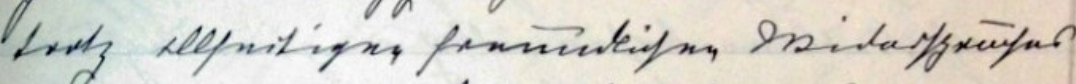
trotz allseitigen freundlichen Widerstandes,
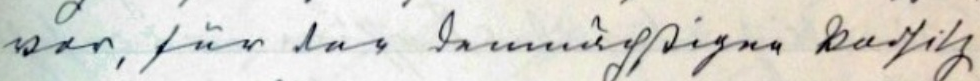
für den demnächstigen Vorsitz
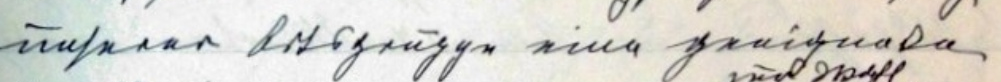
Vorsitz unserer Ortsgruppe eine geeignete
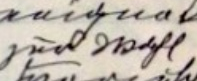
zur Wahl
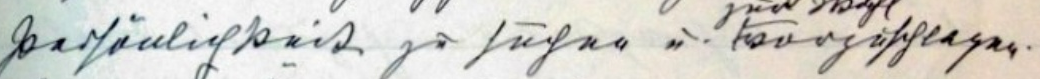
Persönlichkeit zu suchen u. vorzuschlagen.
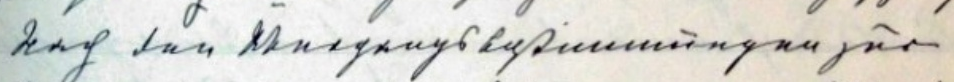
Nach den Vorgangsbestimmungen zur
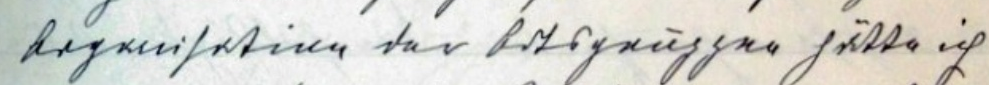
Organisation der Ortsgruppen hätte ich
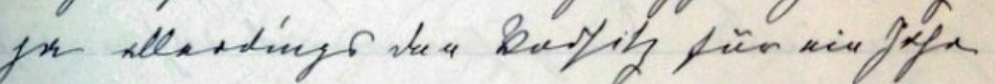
ja allerdings den Vorsitz für ein Jahr
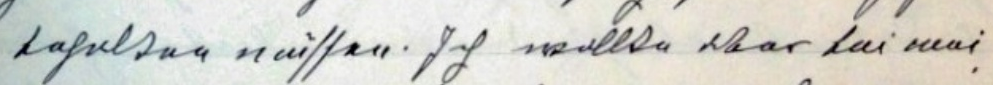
behalten müssen. Ich wollte aber bei mei
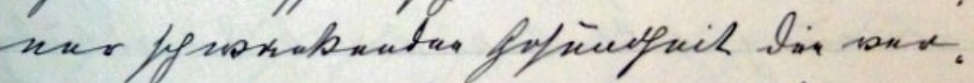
ner schwankenden Gesundheit den ver
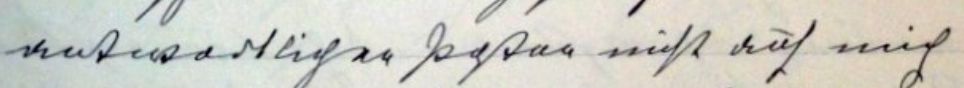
verantwortlichen Posten nicht nicht auf
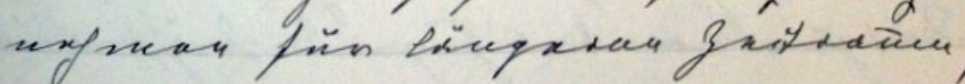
mich nehmen für längeren Zeitraum,
